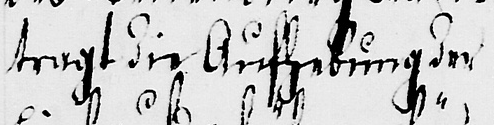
rch die neue Straßen-
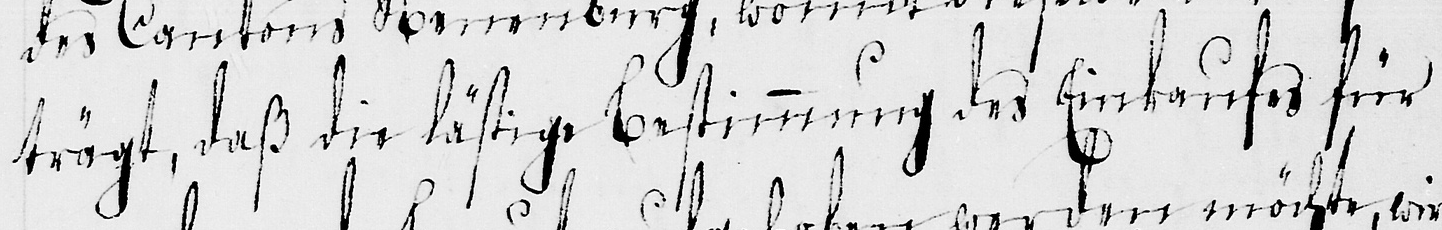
trägt, daß die lästige Bestimmung des Einkaufes für
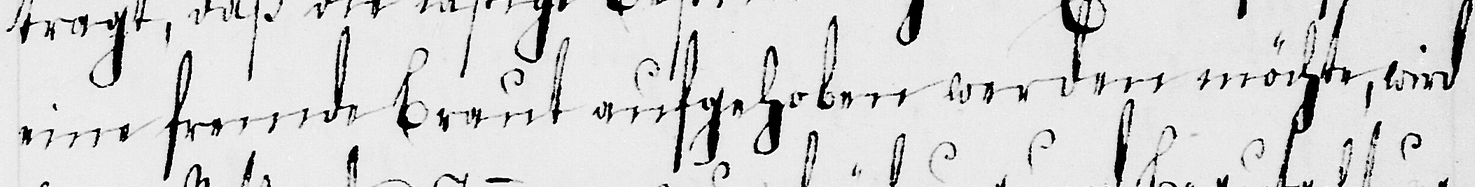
eine fremde Braut aufgehoben werden möchte, wird
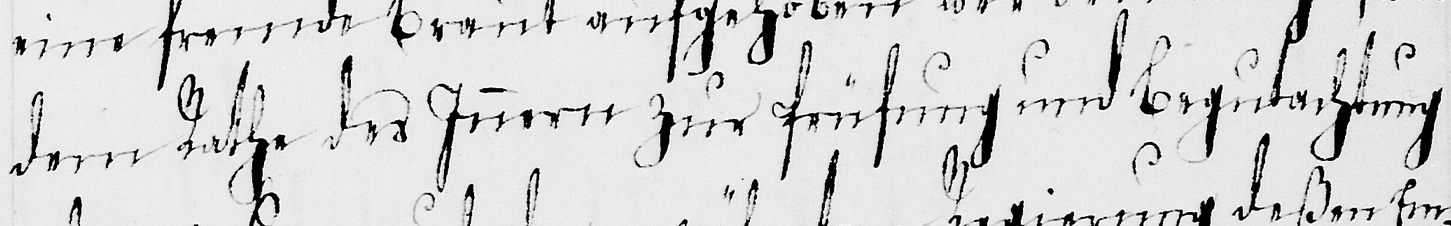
dem Rathe des Innern zur Prüfung und Begutachtung
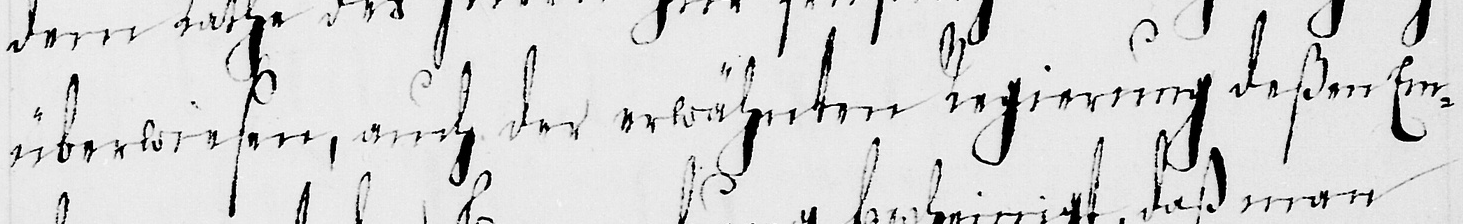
überwiesen, auch der erwähnten Regierung deßen Em¬
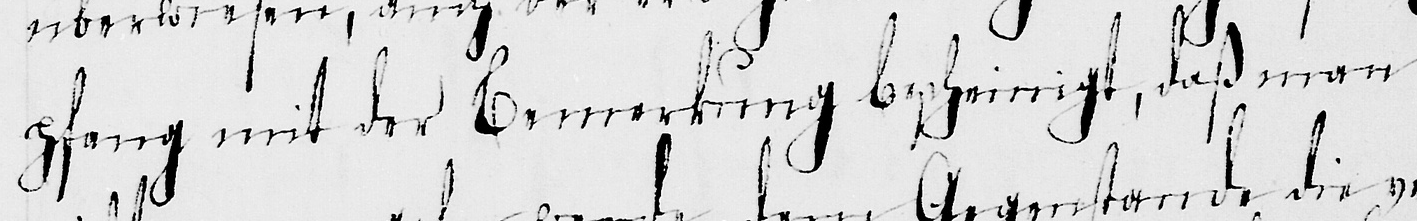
pfang mit der Bemerkung bescheinigt, daß man
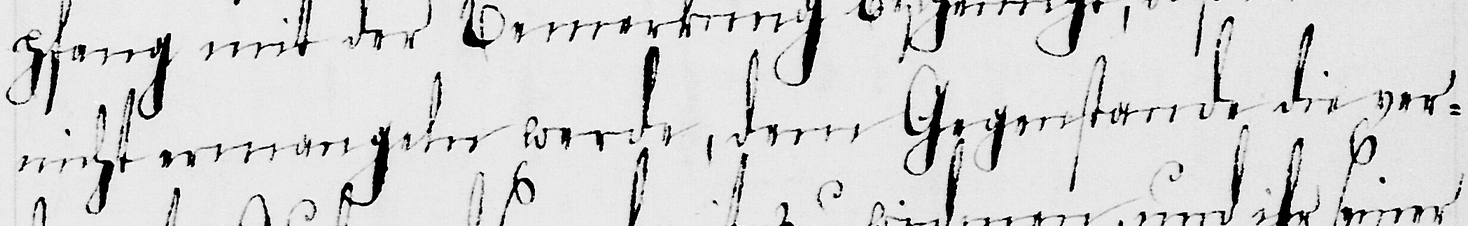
nicht ermangeln werde, dem Gegenstande die ver¬
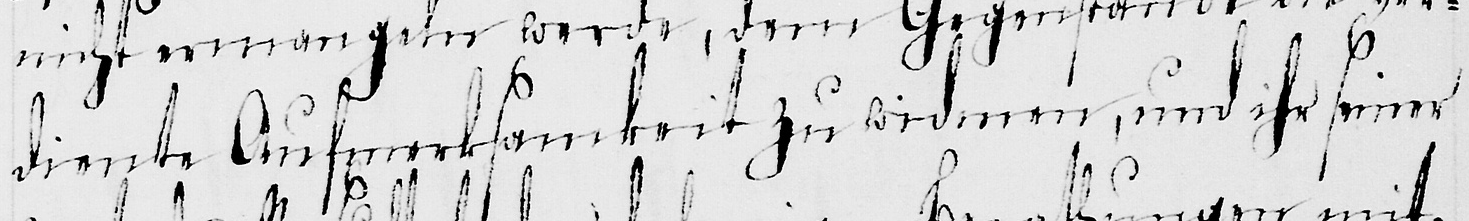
diente Aufmerksamkeit zu widmen, und ihr seiner
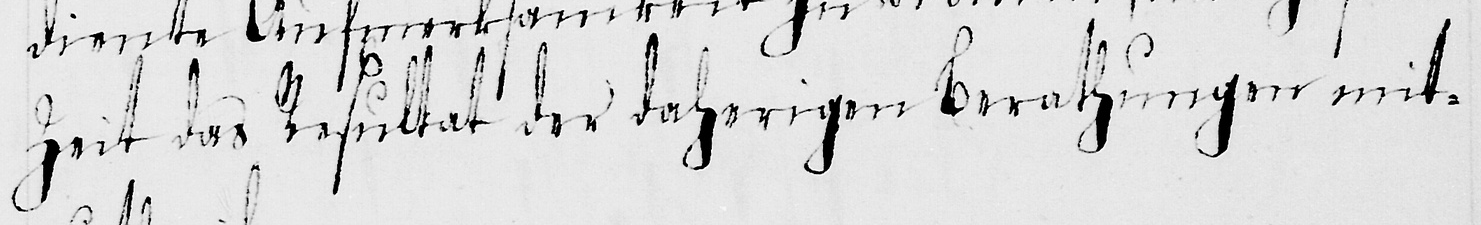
Zeit das Resultat der daherigen Berathung mit¬
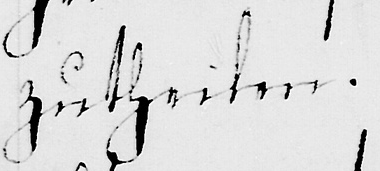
zutheilen.
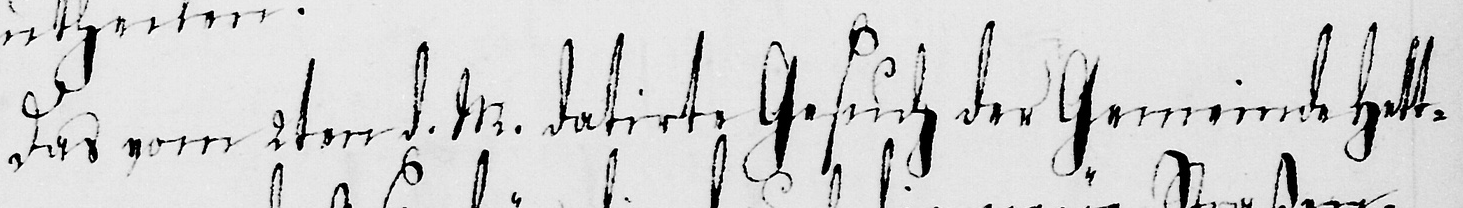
Das vom 2ten d. M. datirte Gesuch der Gemeinde Het¬
